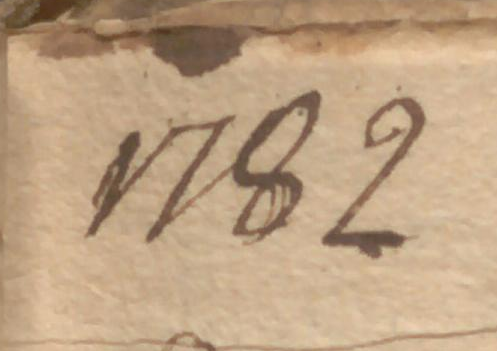1782
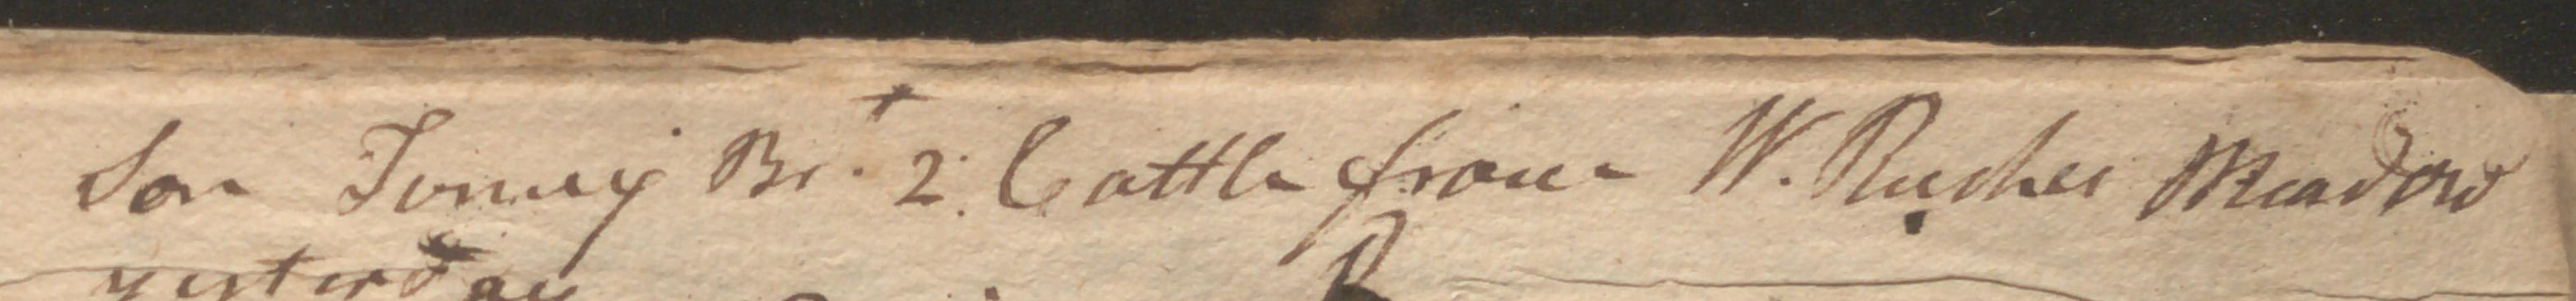Son Tomey Br^t. 2 Cattle from W. Rushes Meadow
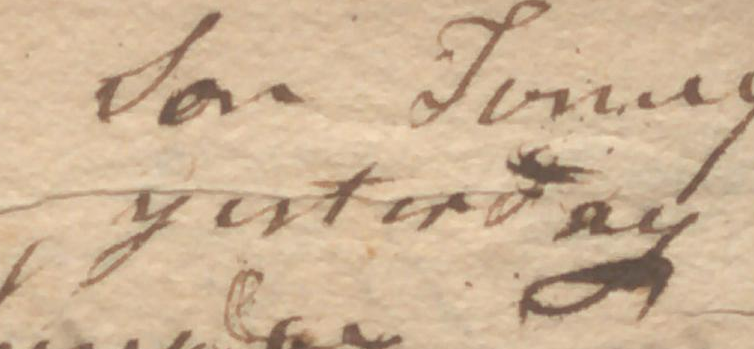yesterday
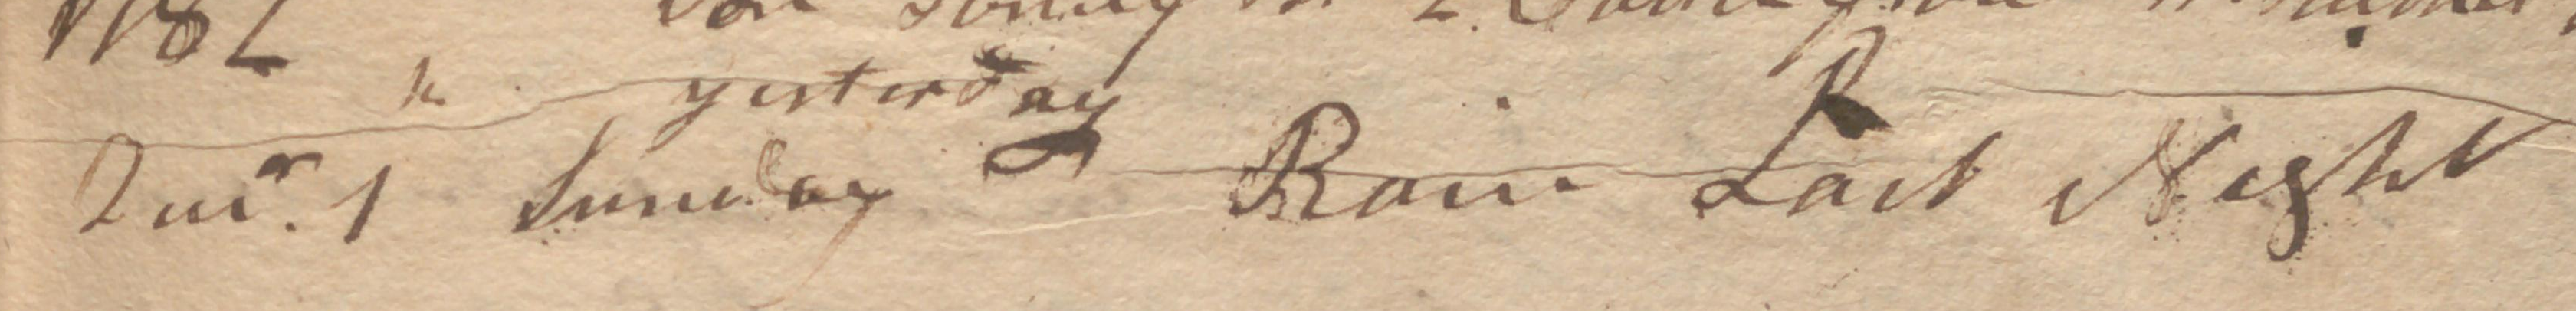Dec^r. 1^th Sunday Rain Last Night
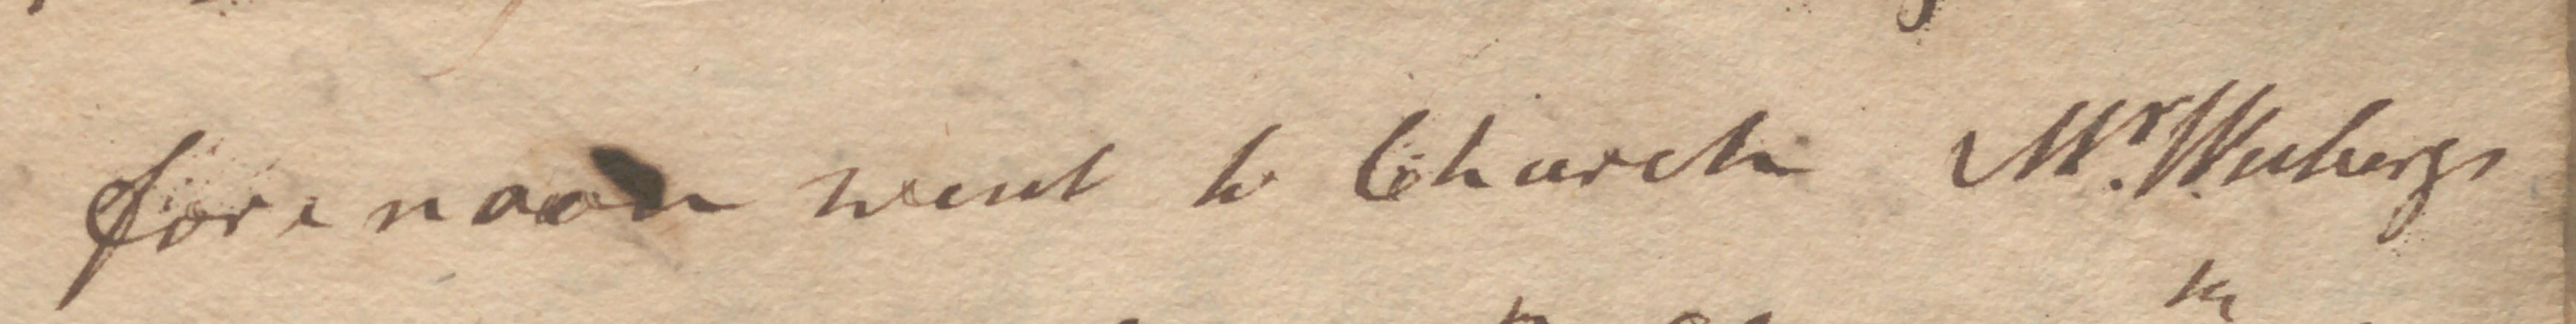forenoon went to Church M^r. Weibergs
